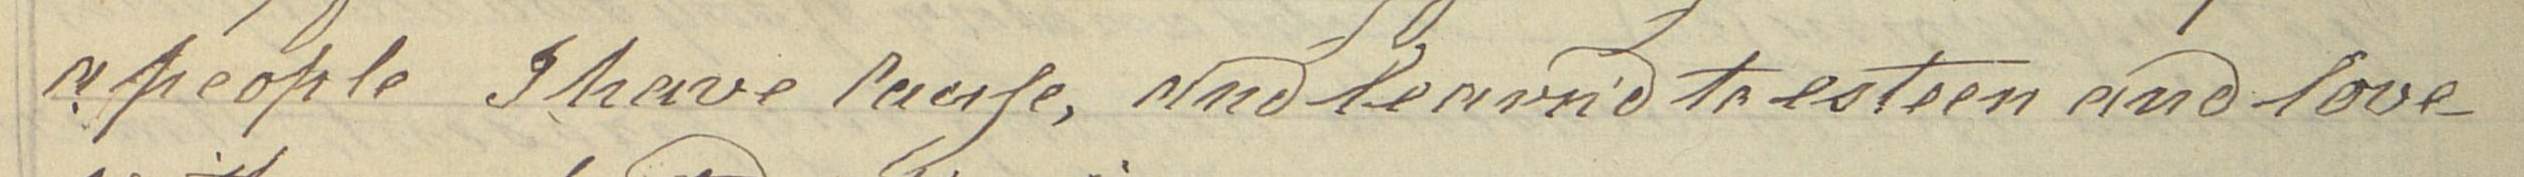a people I have Cause, and learn'd to esteem and love
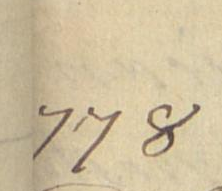-778
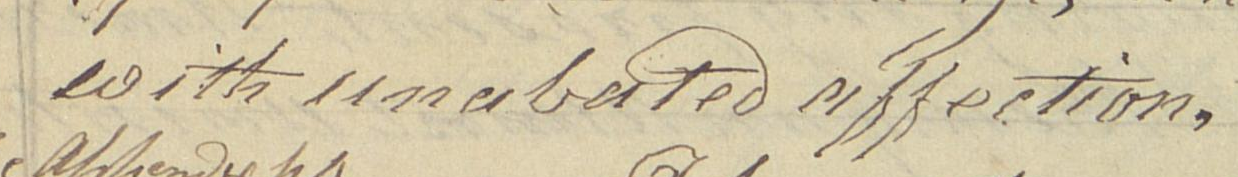with unabated affection.
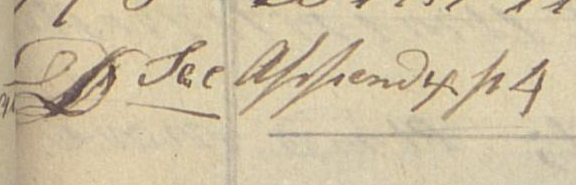D. See Appendix p 4
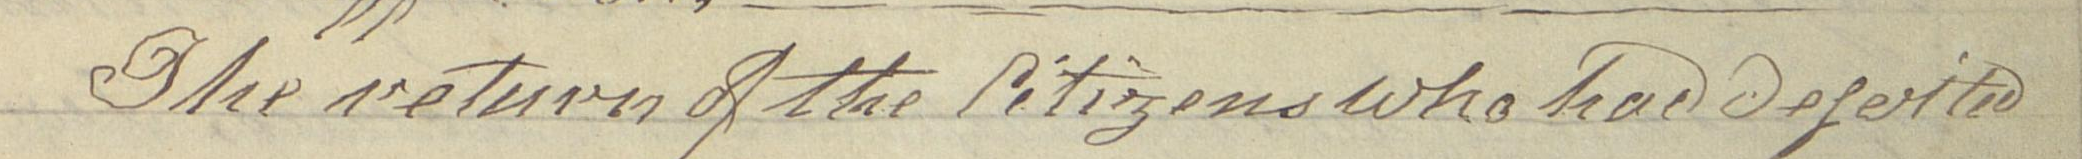The return of the Citizens who had deserted
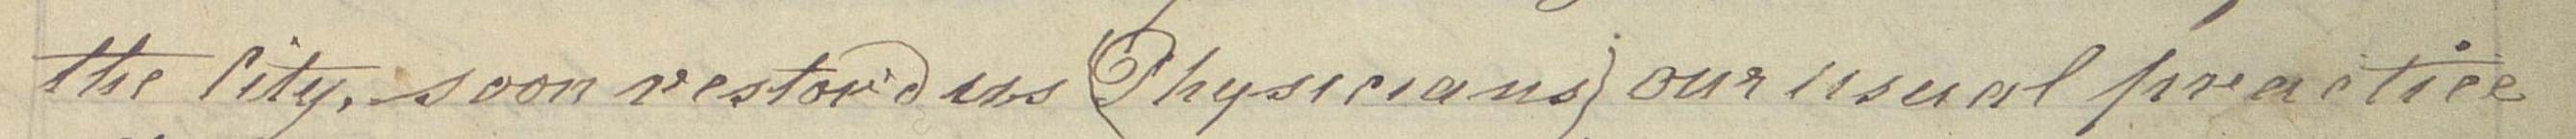the City, soon restor'd us (Physicians) our usual practice
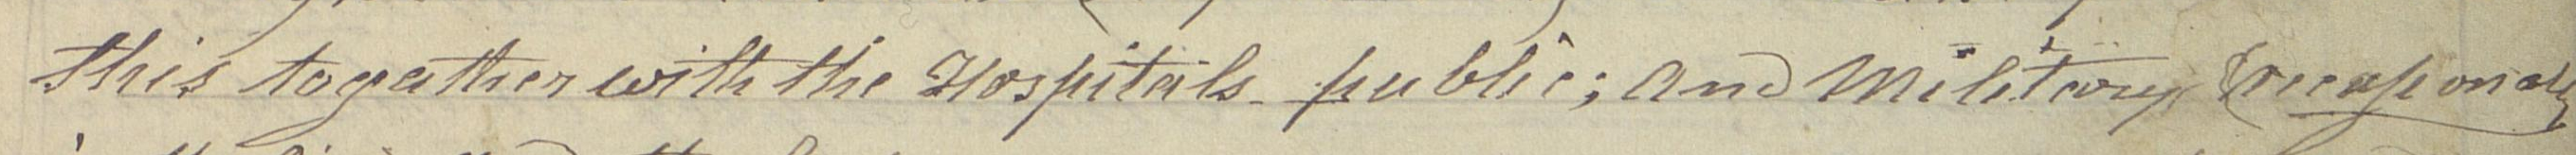This togather with the Hospitals public; and Military (recassonally
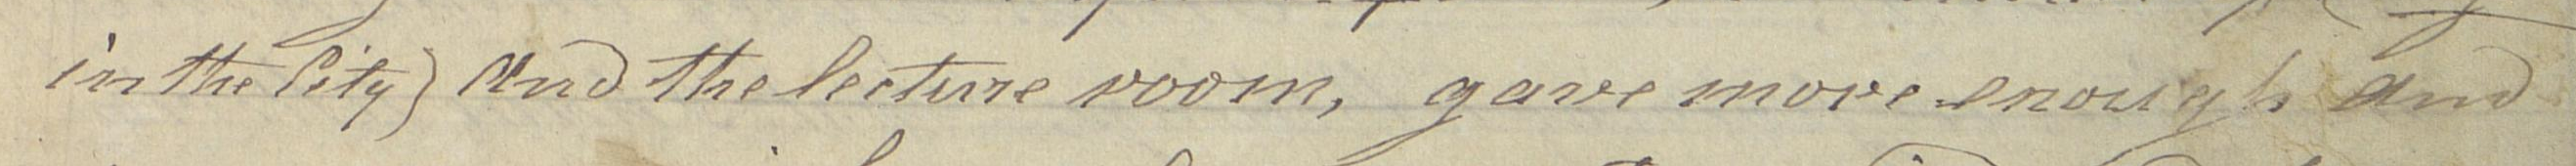in the City) And the lecture room, gave move enough and
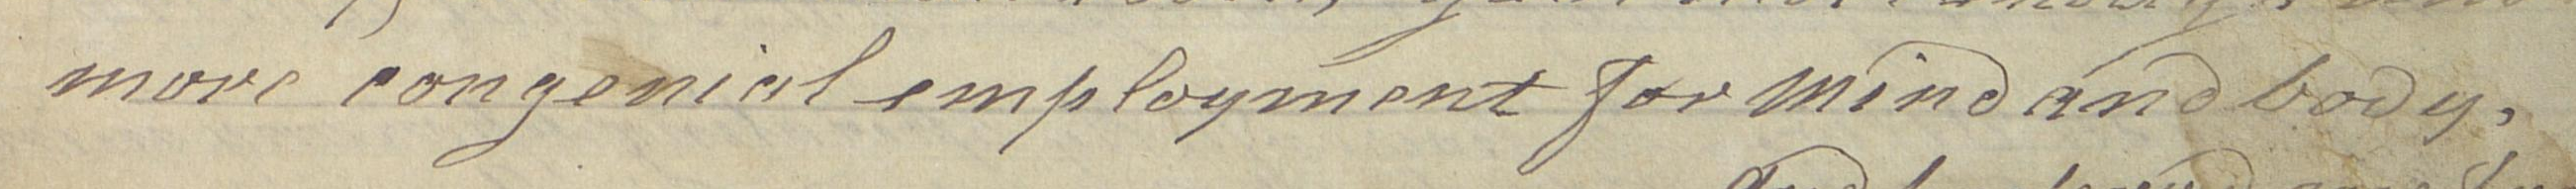more congenial employment for mind and body.
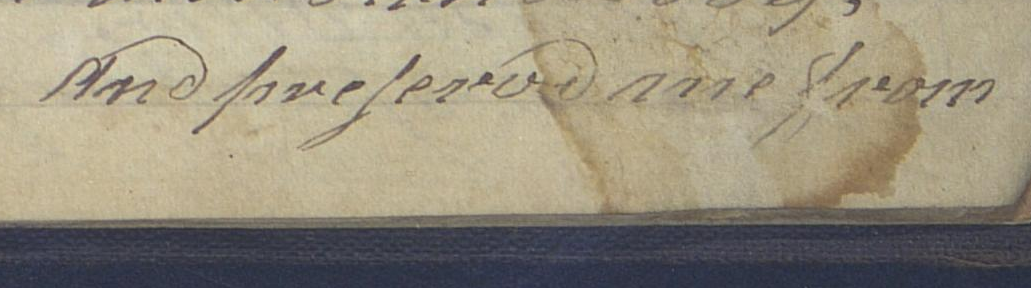and preserved me from
